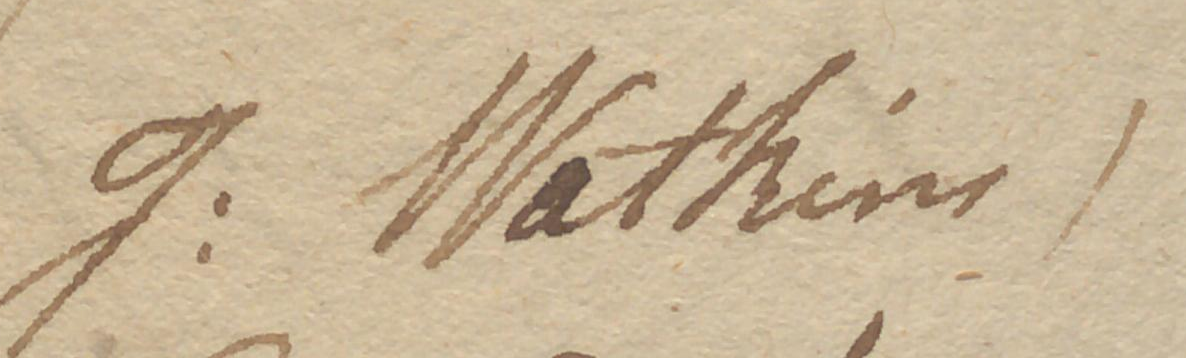J. Watkins
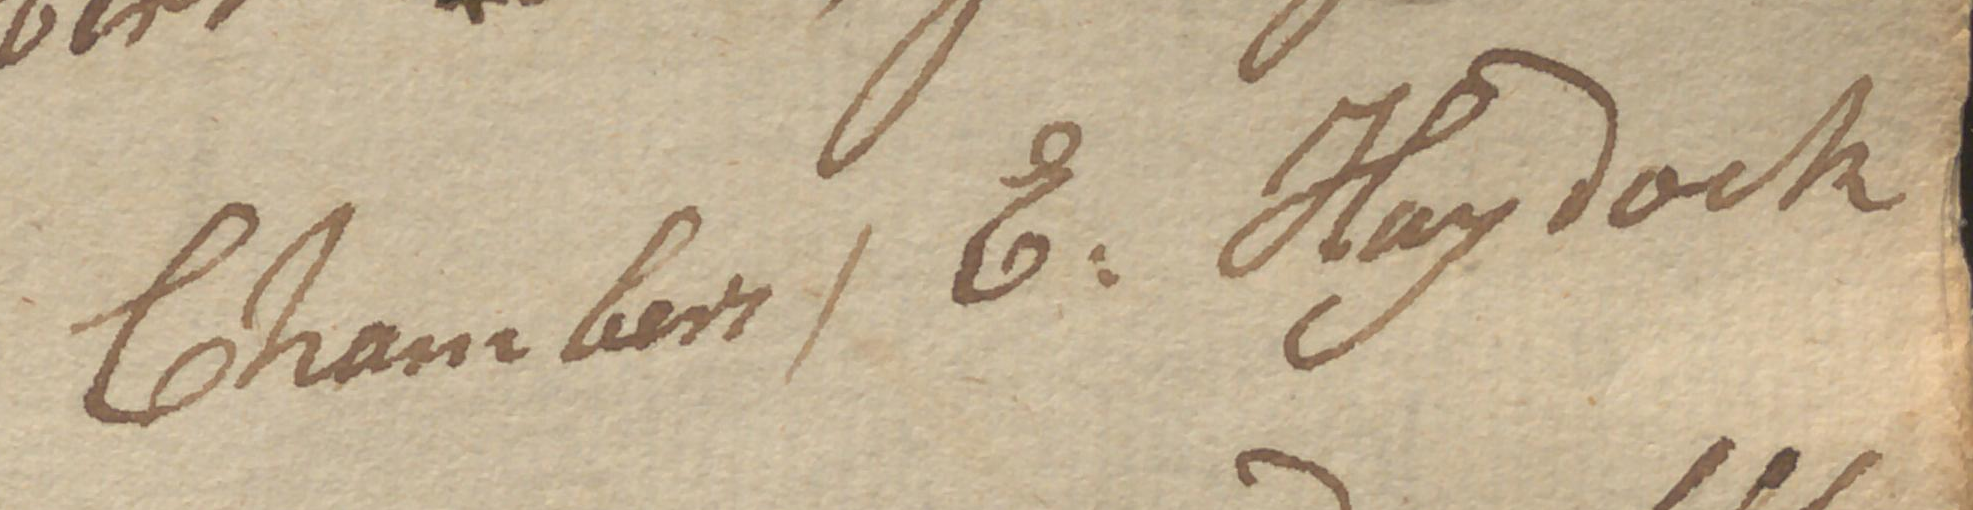Chambers E: Haydock
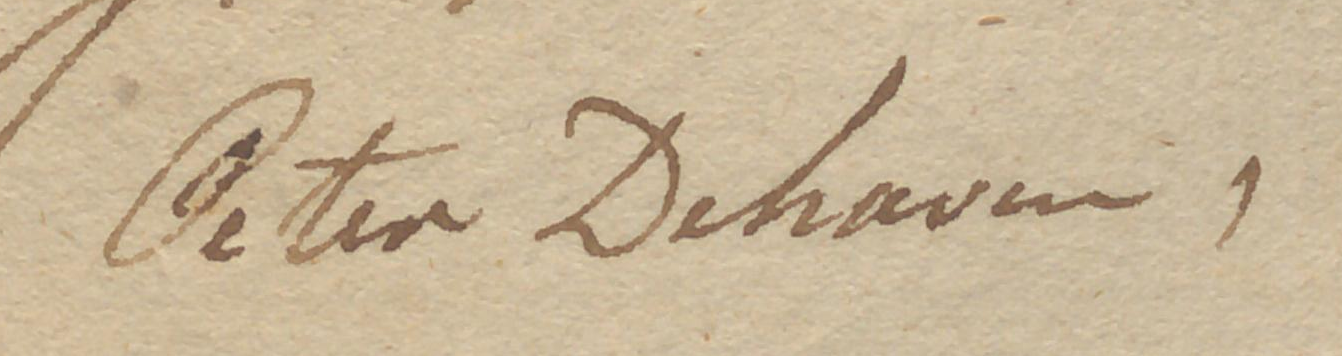Peter Dehavens
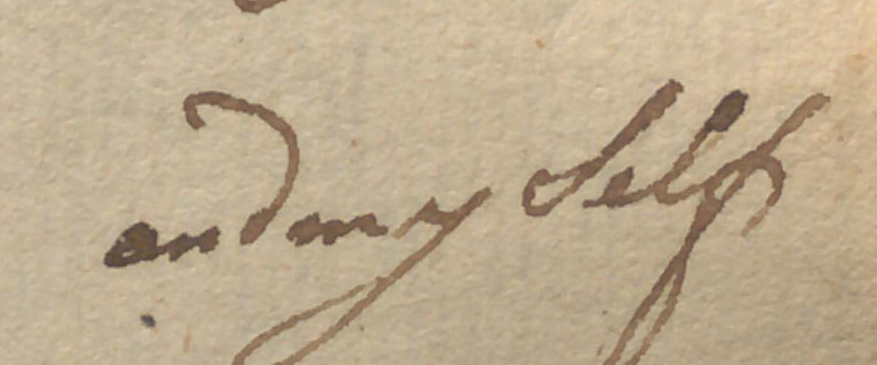and my Self
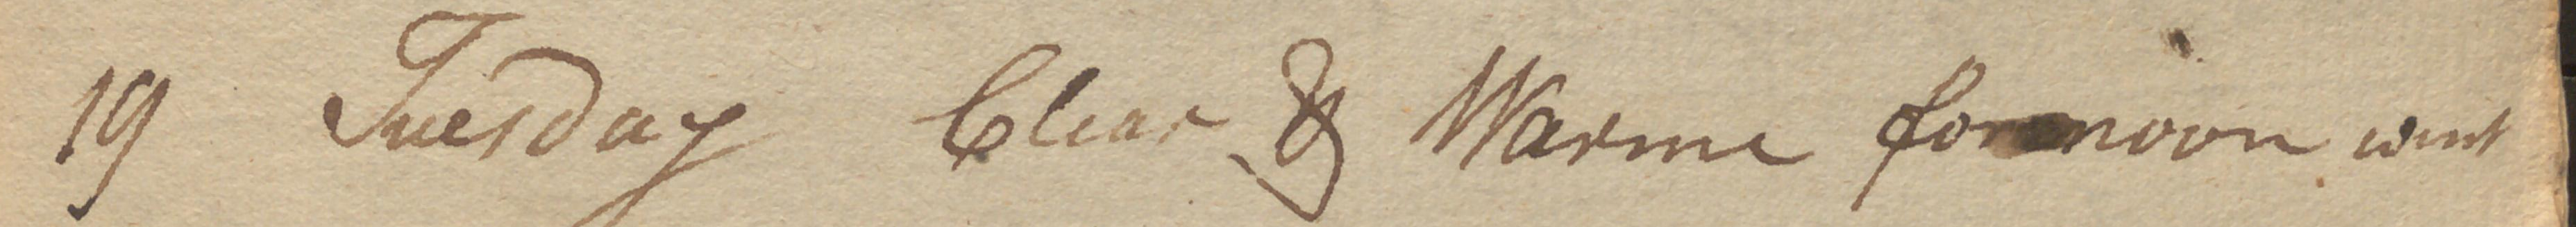19 Tuesday Clear & Warme forenoon went
